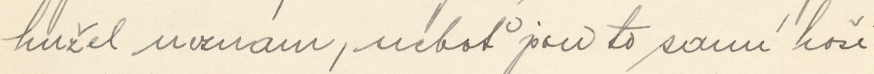hužel neznám, neboť jsou to samí hoši
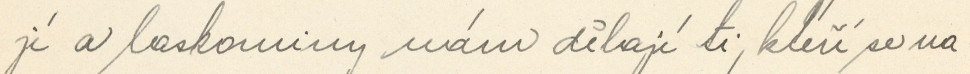jí a laskominy nám dělají ti, kteří se na-
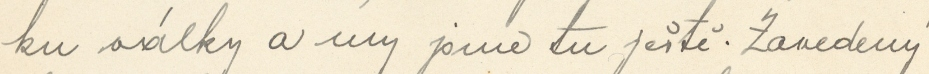ku války a my jsme tu ještě. Zavedený
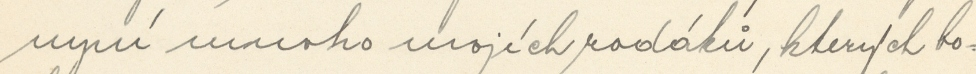nyní mnoho mojích rodáků, kterých bo-
